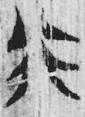行
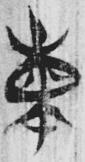柬（簡）
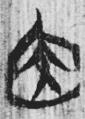因
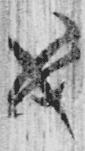民
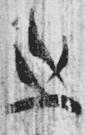之
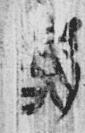欲
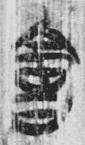會
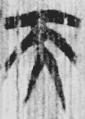天
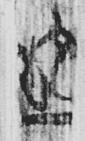○（地）
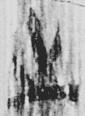之
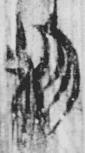利（利）
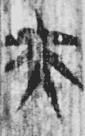夫
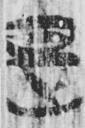是
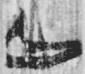㠯（以）
